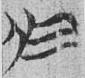於
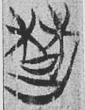楚
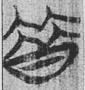昔
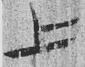上
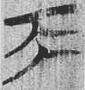天
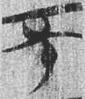不
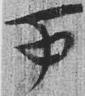𠁩（衷）
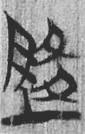○（降）
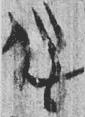○（禍）
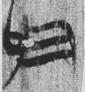於
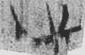我
